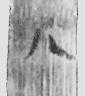八
